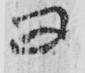日
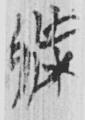○（差）
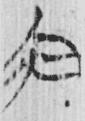亦
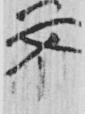不
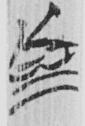爲
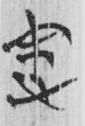○（災）
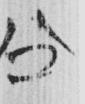公
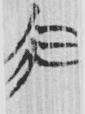亦
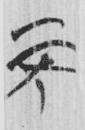不
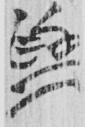爲
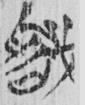○（害）
